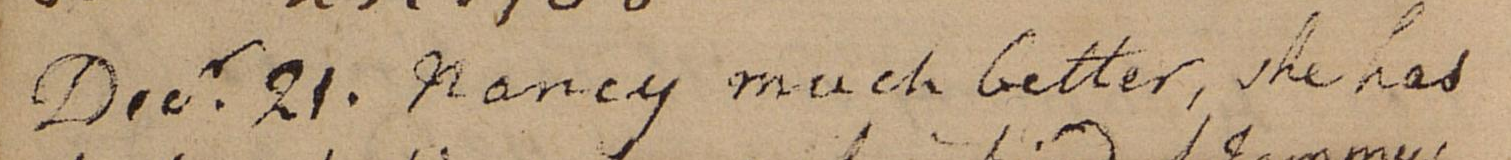Dec^r. 21. Nancy much better, she has
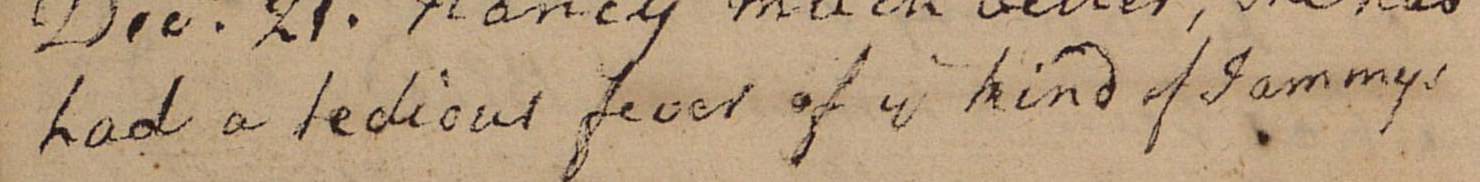had a tedious fever of y^e kind of Jammys
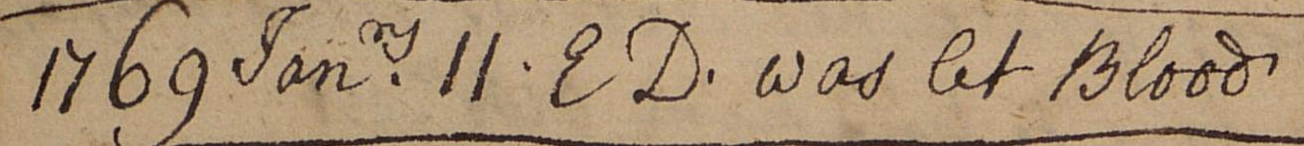1769 Jan^ry. 11. E D. was let Blood
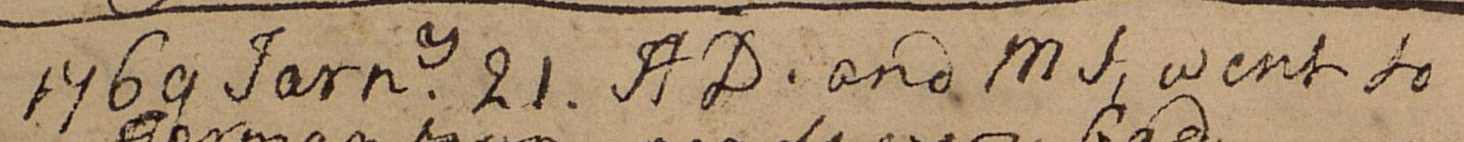1769 Jarn^y. 21 HD. and MS, went to
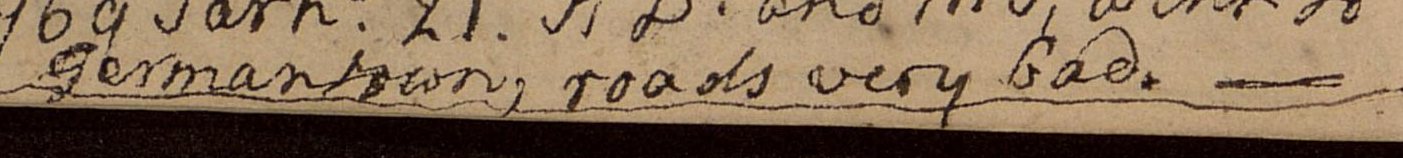Germantown, roads very bad.-
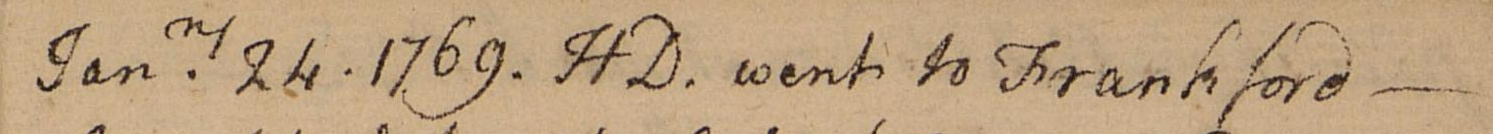Jan^ry. 24. 1769. H D. went to Frankford-
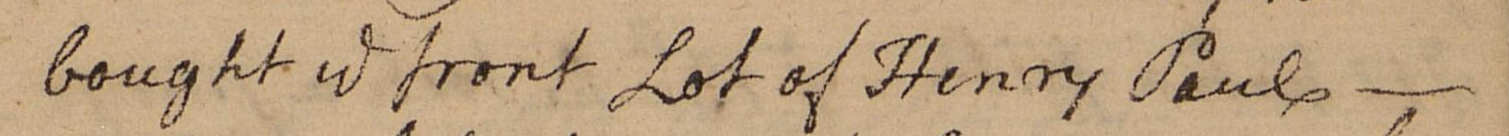bought y^e front Lot of Henry Paul-
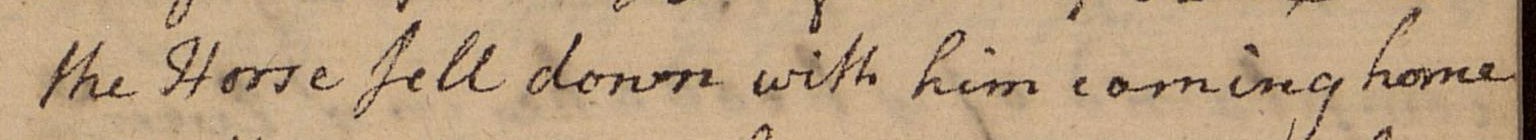the Horse fell down with him coming home
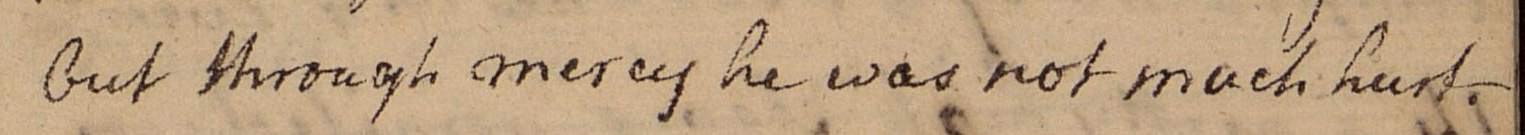but through mercy he was not much hurt.
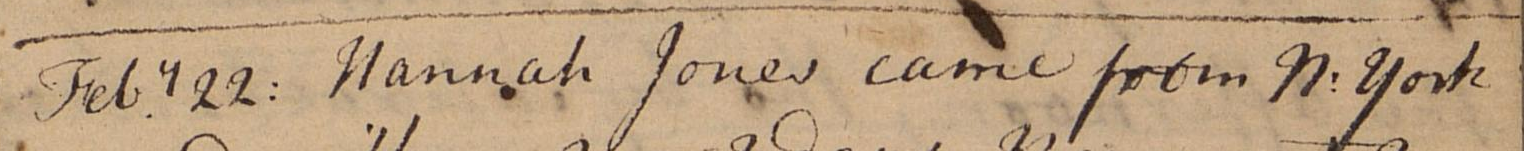Feb^y 22: Hannah Jones came from N. York
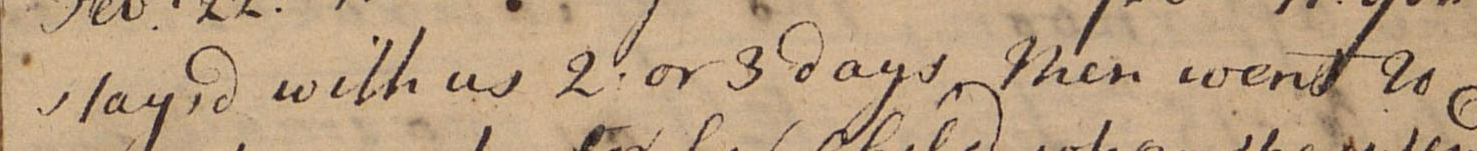stay'd with us 2 or 3 days, then went to
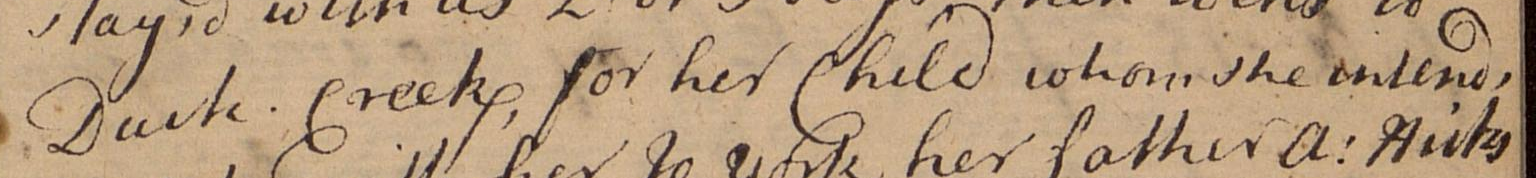Duck Creek, for her Child whom she intends
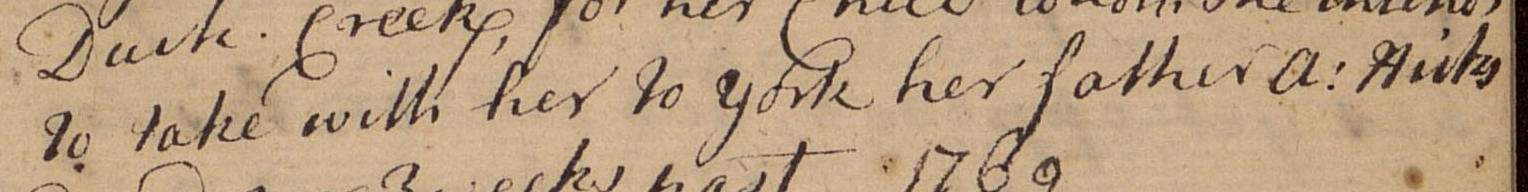to take with her to York her father A: Airty
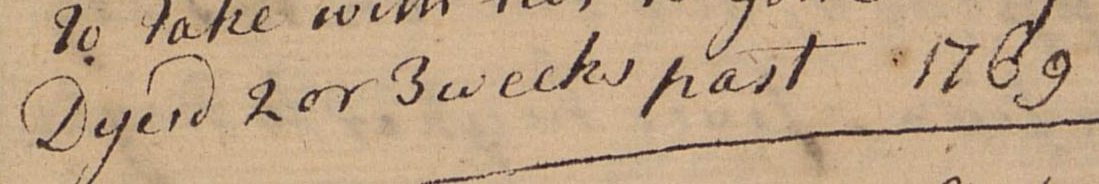Dyerd 2 or 3 weeks past 1769
